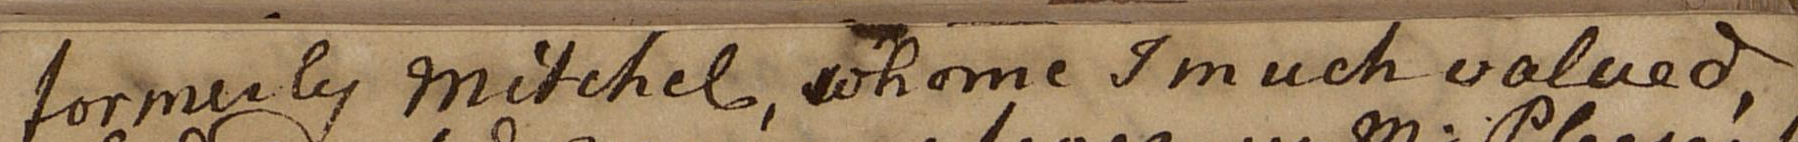formerly Mitchel, whome I much valued,
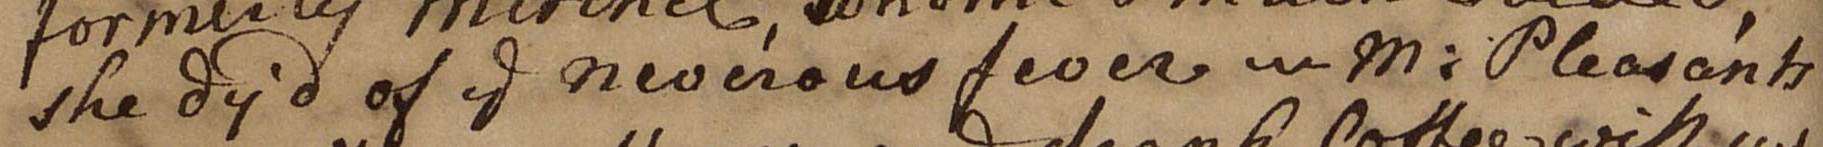she dy'd of y^e neverous fever- M: Pleasants
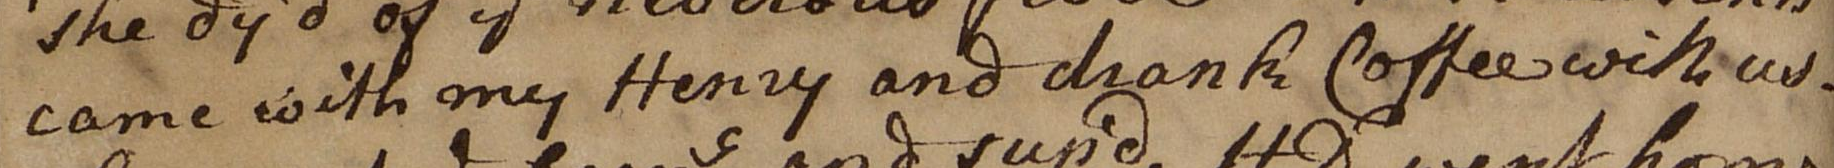came with my Henry and drank Coffee with us-
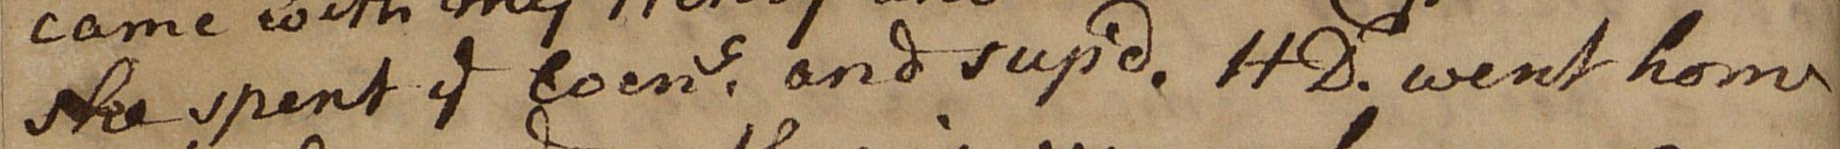he spent y^e Even.^g and sup'd. HD. went home
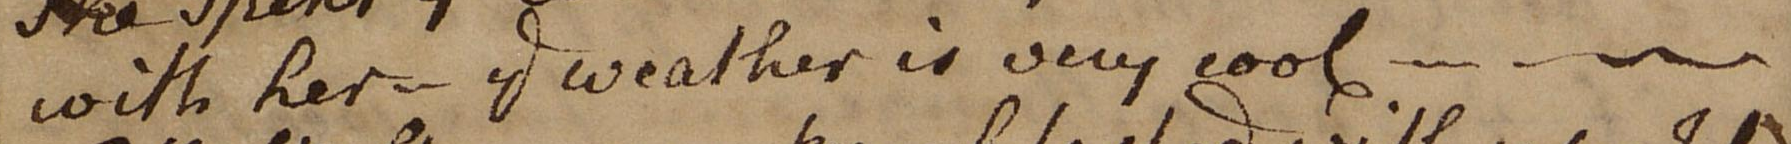with her- y^e weather is very cool---
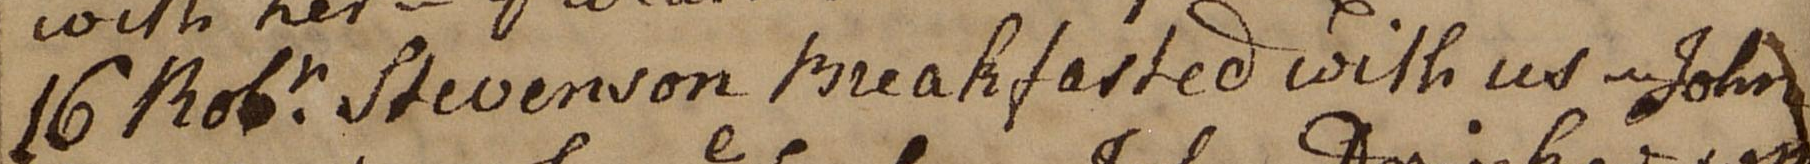16 Rob^t. Stevenson Breakfasted with us- John
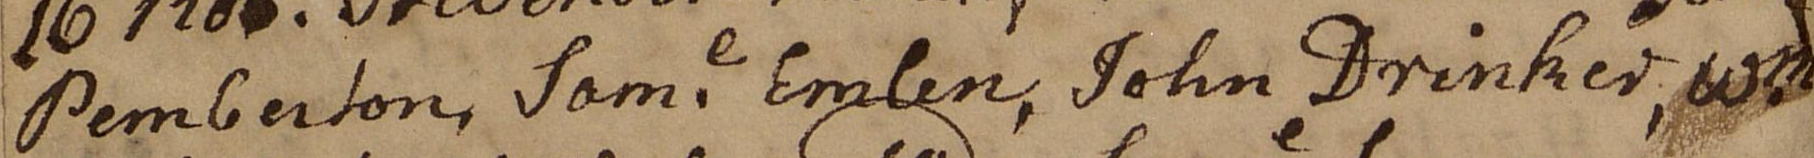Pemberton, Sam^l Emlen, John Drinker, W^m.
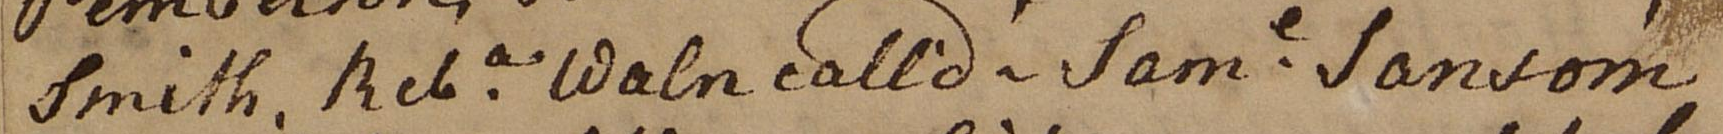Smith, Reb^a Waln call'd- Sam^l. Sansom
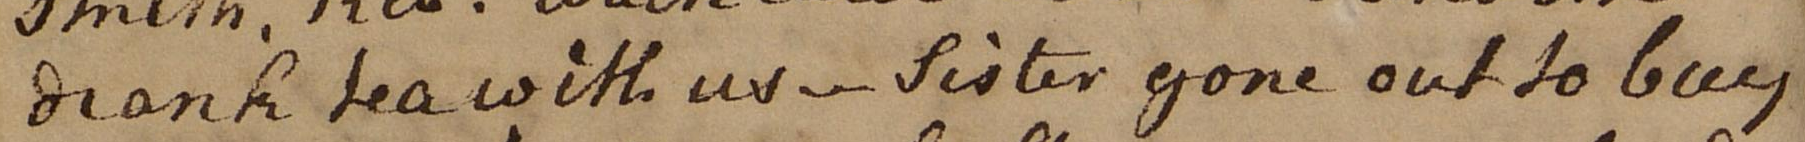drant tea with us- Sister gone out to buy
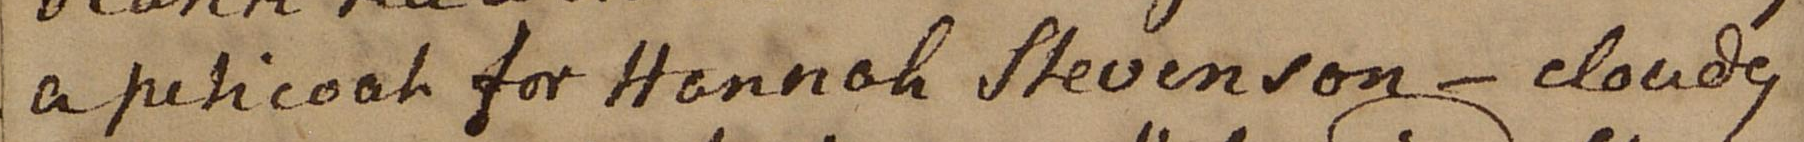a peticoat for Hannah Stevenson- cloudy
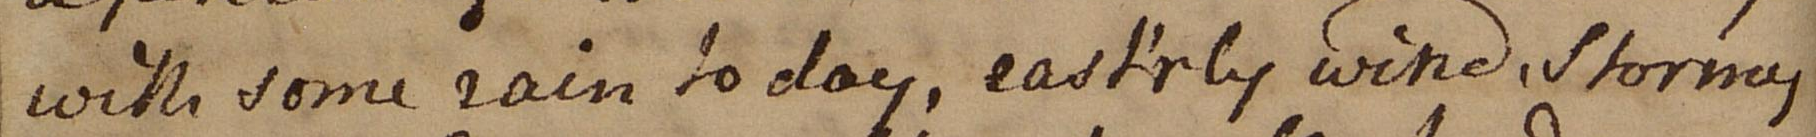with some rain to day, east'rly wind, Stormy
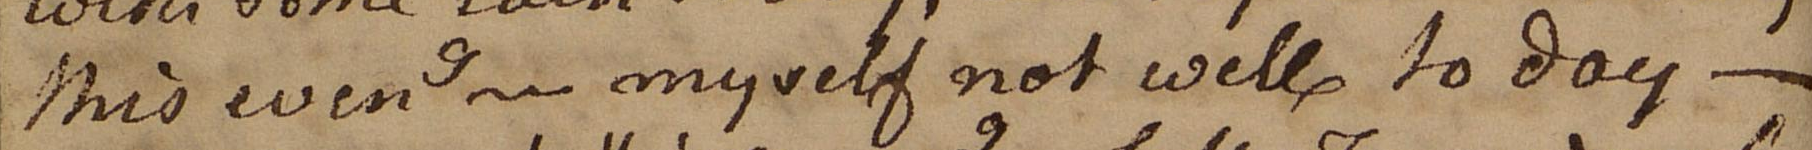this even^g- myself not well to day-
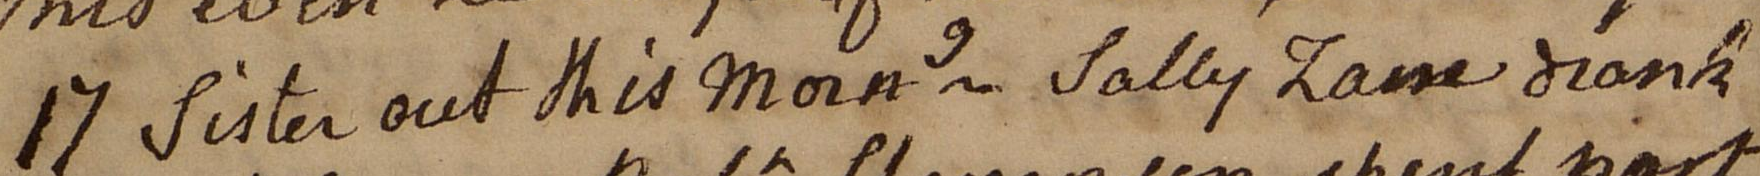17 Sister out this morn^g- Sally Zane drank
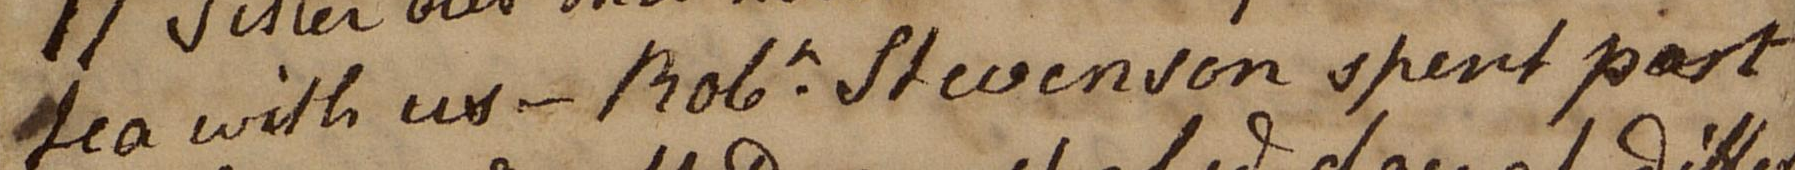tea with us- Rob^t. Stevenson spent part
